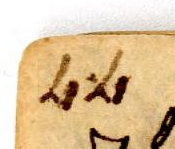44
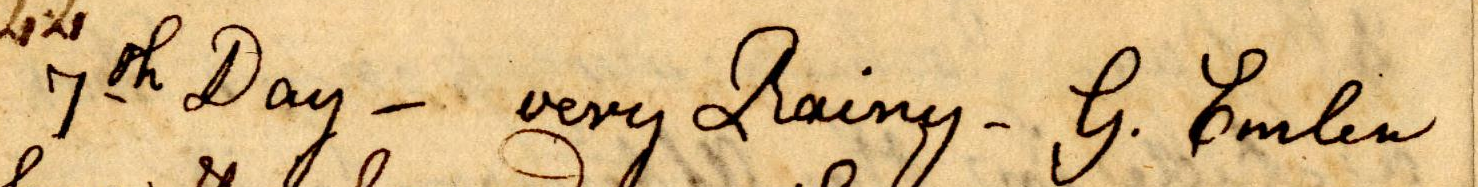7^th Day- very Rainy- G. Emlen
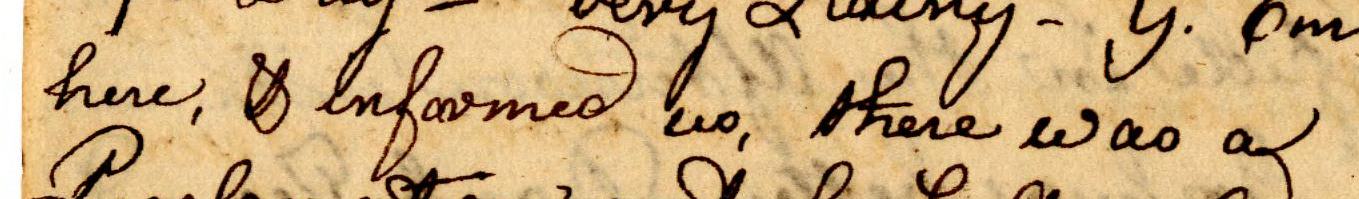here, & informed us, there was a
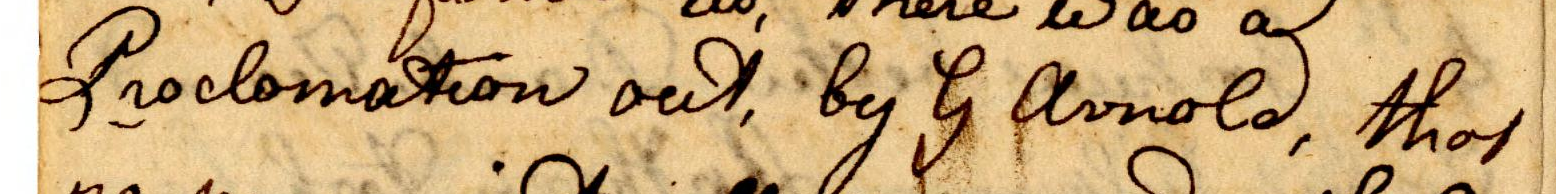Proclamation out, by G Arnold, that
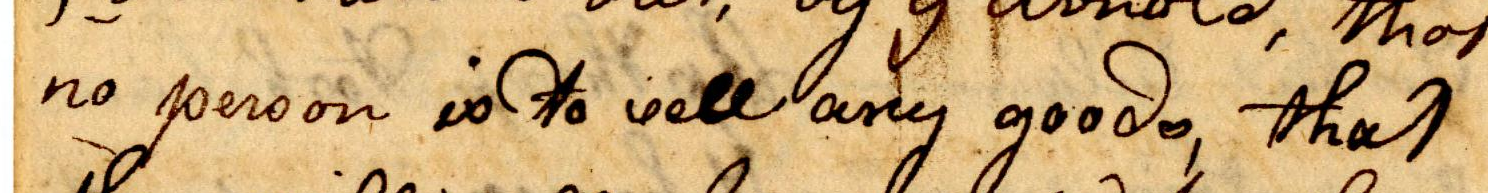no person is to sell any goods, that
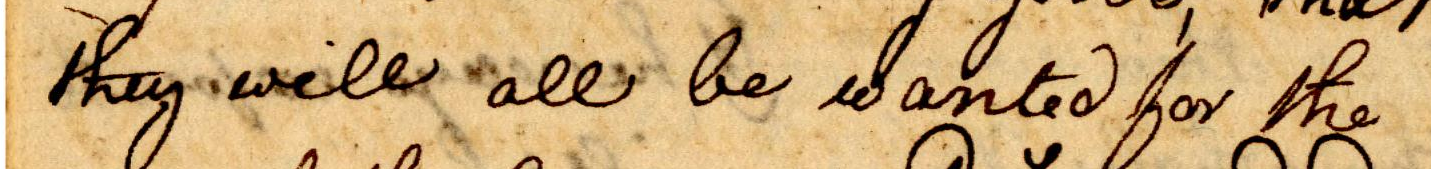they will all be wanted for the
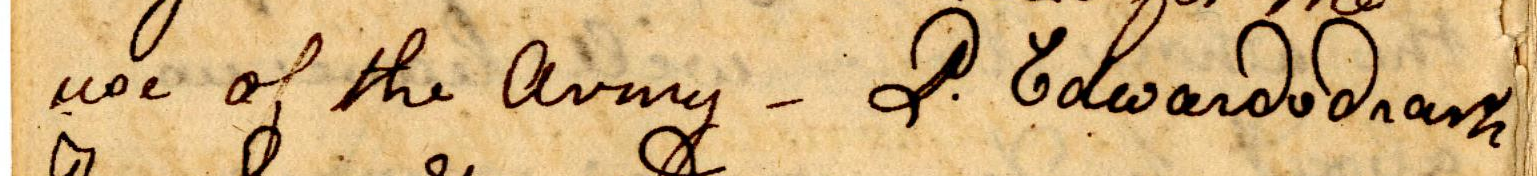use of the Army- P. Edwards drank
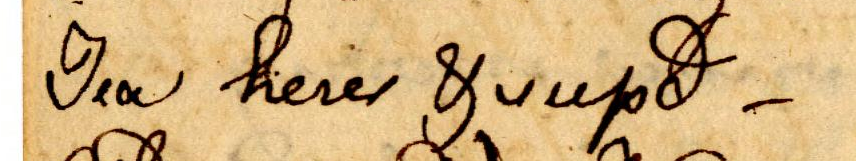Tea here & supd-
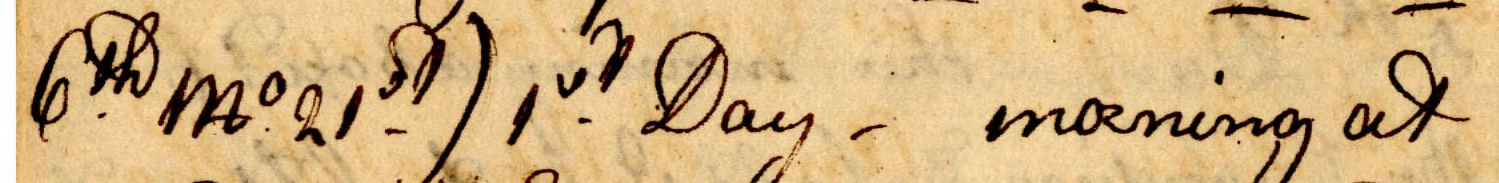6^th M^o 21^st) 1^st Day- morning at
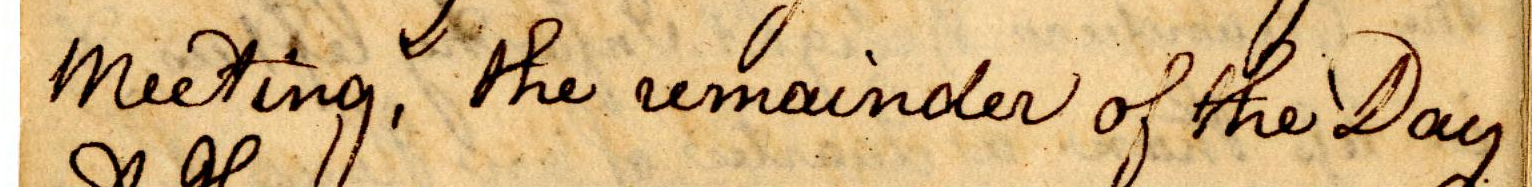Meeting, the remainder of the Day
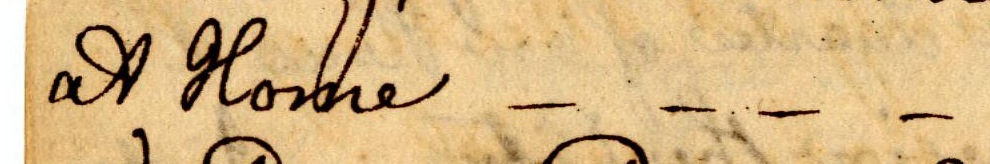at Home----
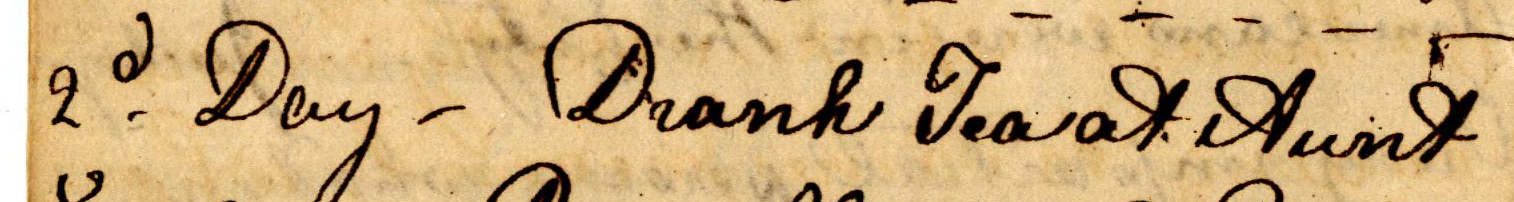2^d. Day- Drank Tea at Aunt
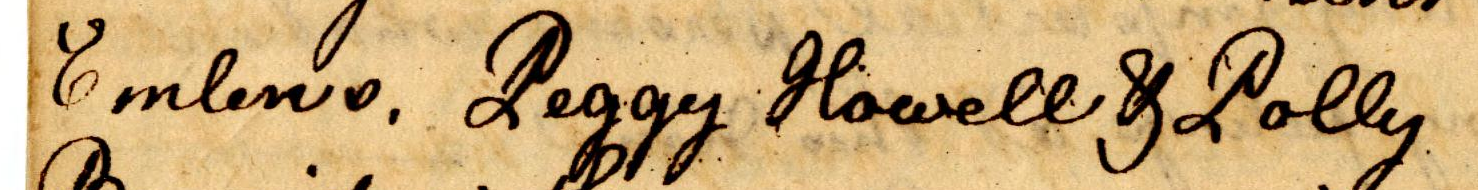Emlens, Peggy Howell & Polly
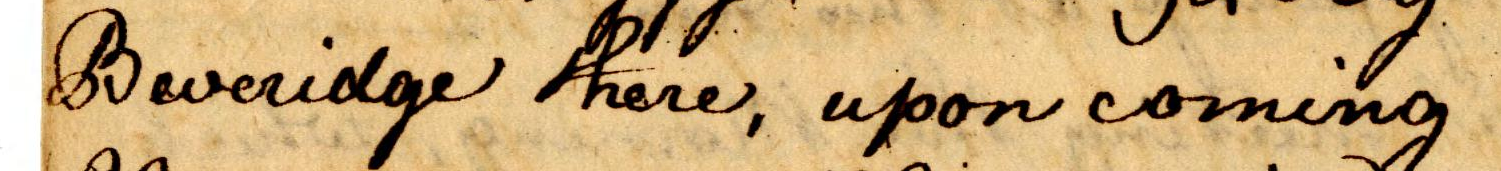Beveridge there, upon coming
